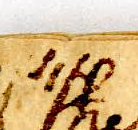44
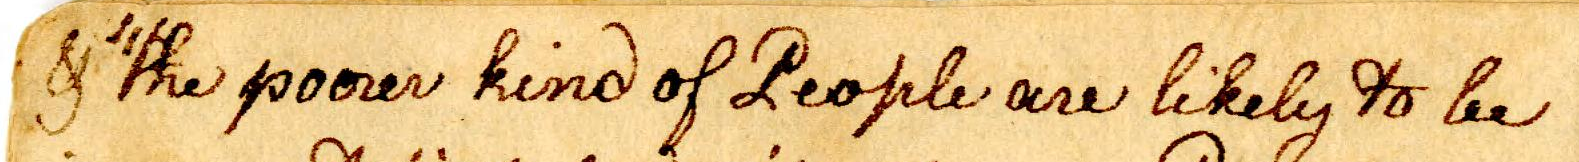& the poorer kind of People are likely to be
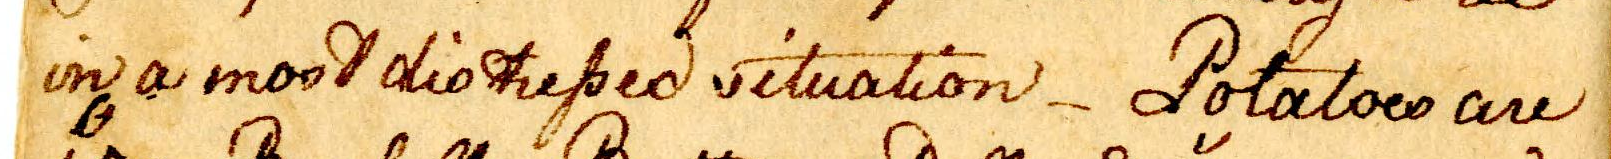in a most distressed situation- Potatoes are
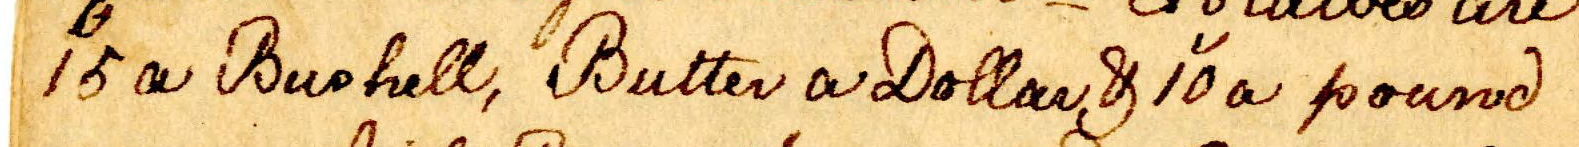15 a Bushell, Butter a Dollar & 10^s a pound
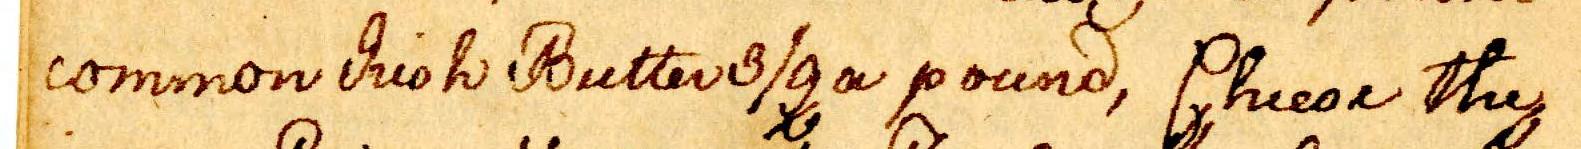common Irish Butter 3s9 a pound, Cheese the
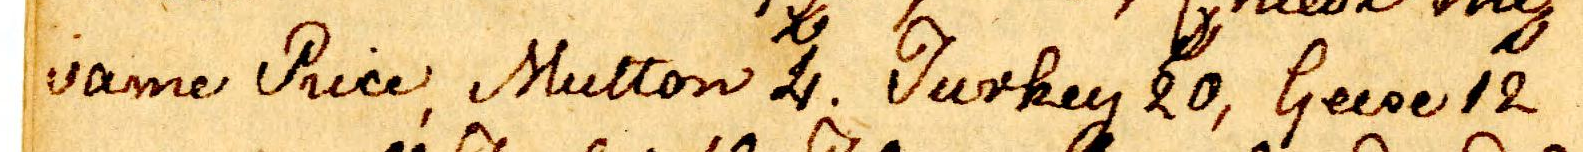same Price, Mutton 4. Turkey 20, Geese 12
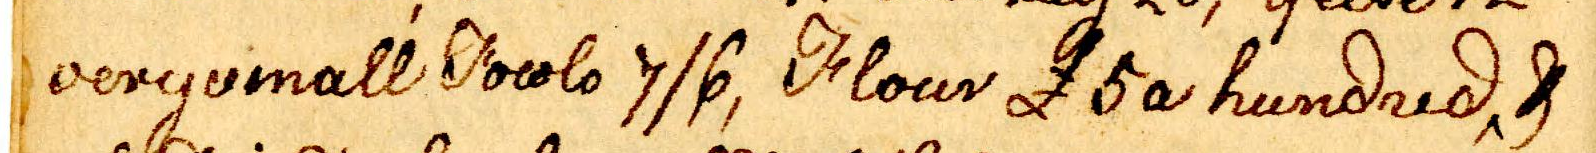very small Fowls 7s6, Flour £5 a hundred, &
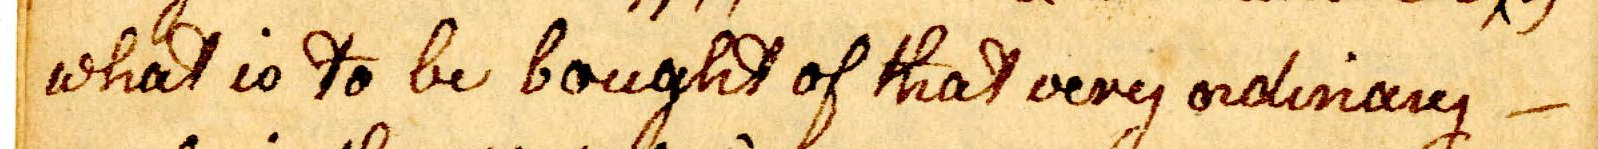what is to be bought of that very ordinary-
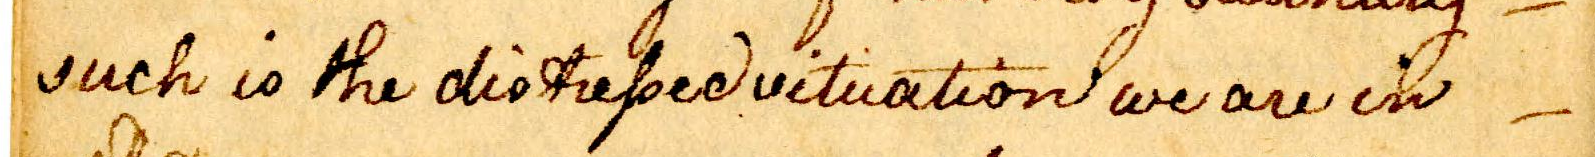such is the distressed situation we are in-
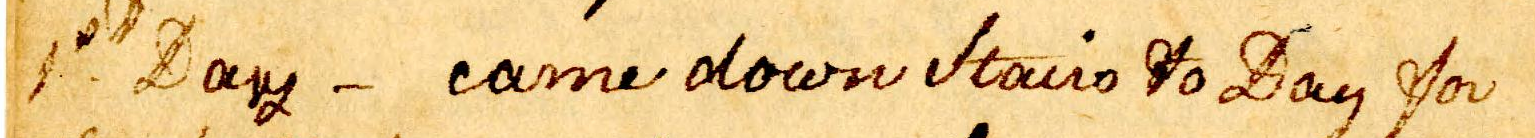1^st. Day- came down Stairs to Day for
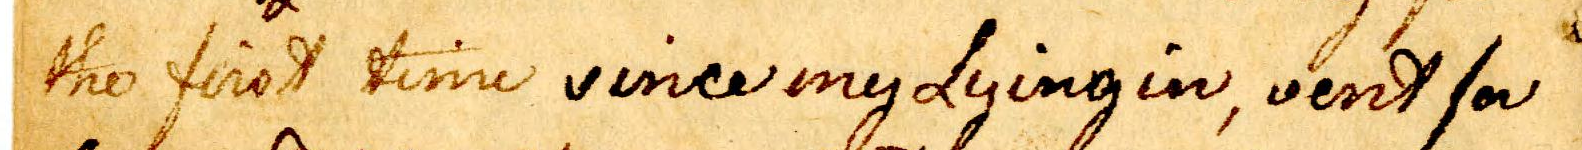the first time since my Lying in, sent for
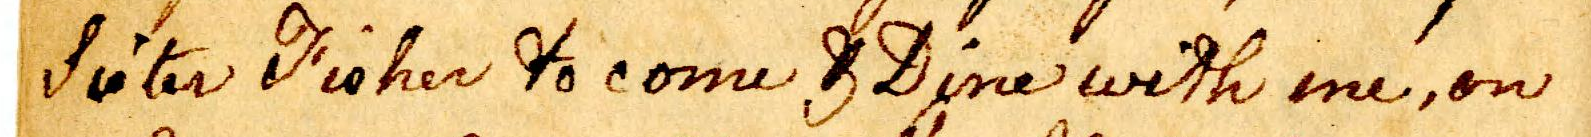Siter Fisher to come & Dine with me, on
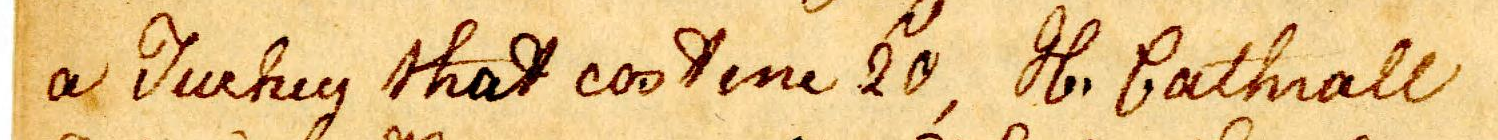a Turkey that cost me 20, H. Cathrall
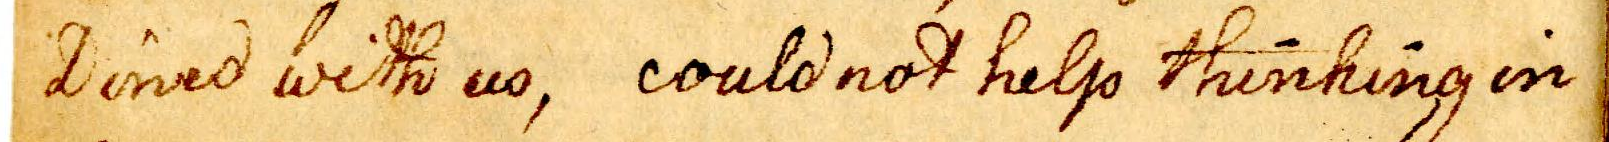Dined with us, could not help thinking in
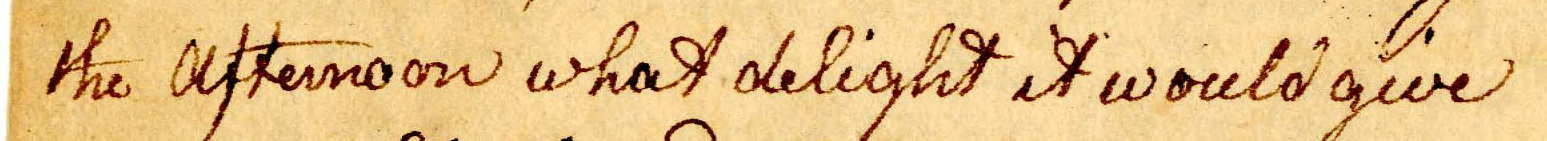the Afternoon what delight it would give
